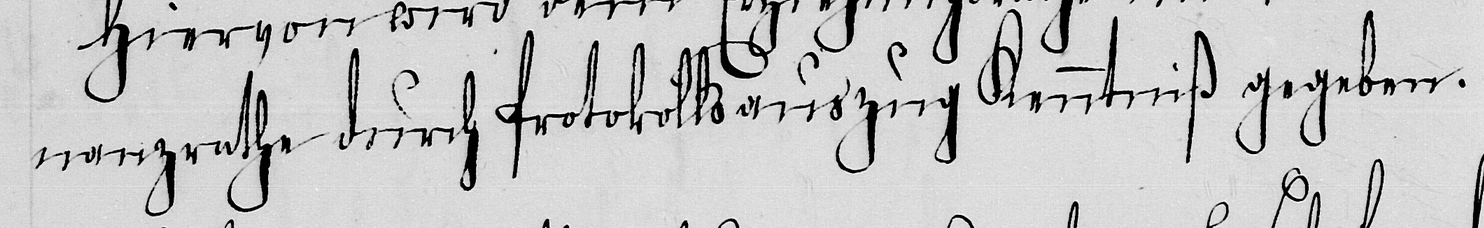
nanzrathe durch Protokollsauszug Kenntniß gegeben.
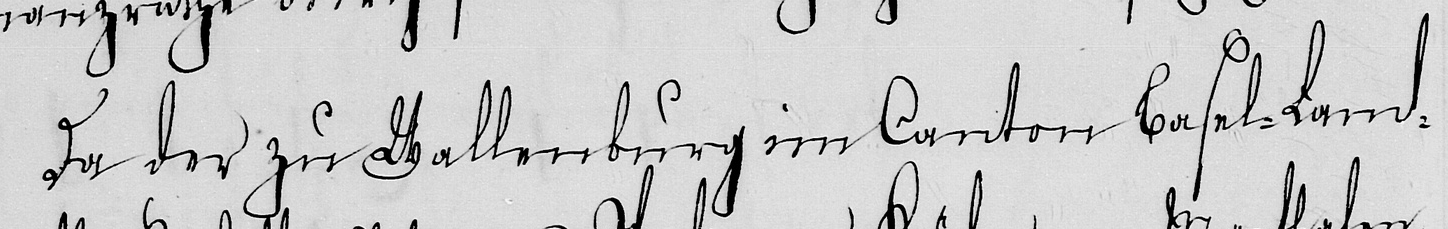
Da der zu Wallenburg im Canton Basel-Lands¬
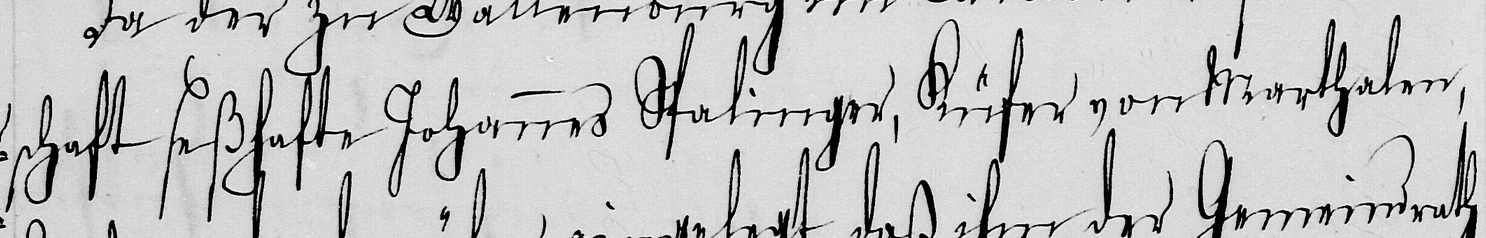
chaft seßhafte Johannes Spalinger, Küfer von Marthalen,
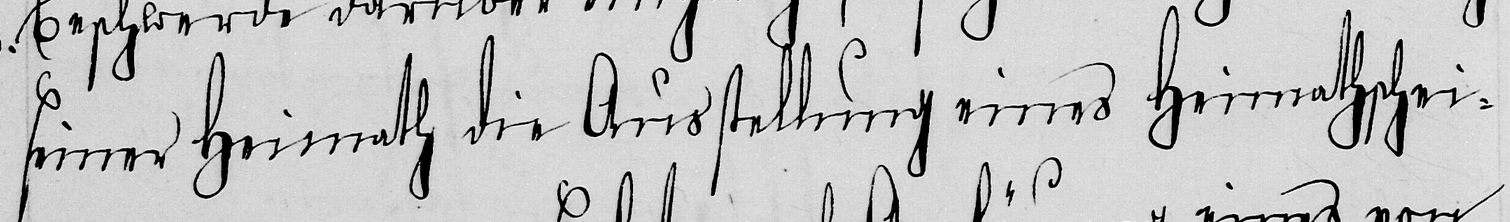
seiner Heimath die Ausstellung eines Heimathschei¬
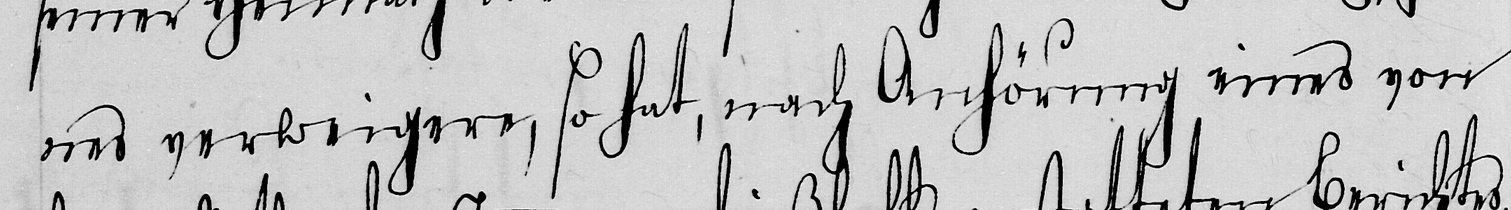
nes verweigere, so hat, nach Anhörung eines von
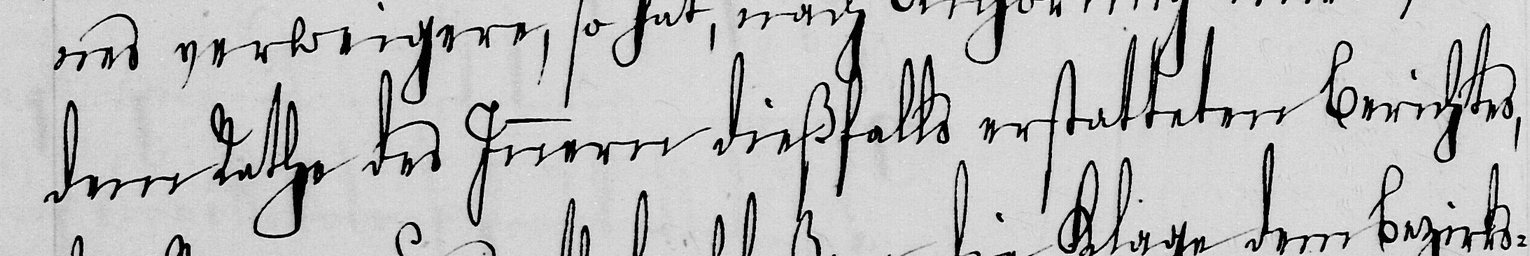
dem Rathe des Innern dießfalls erstatteten Berichte¬
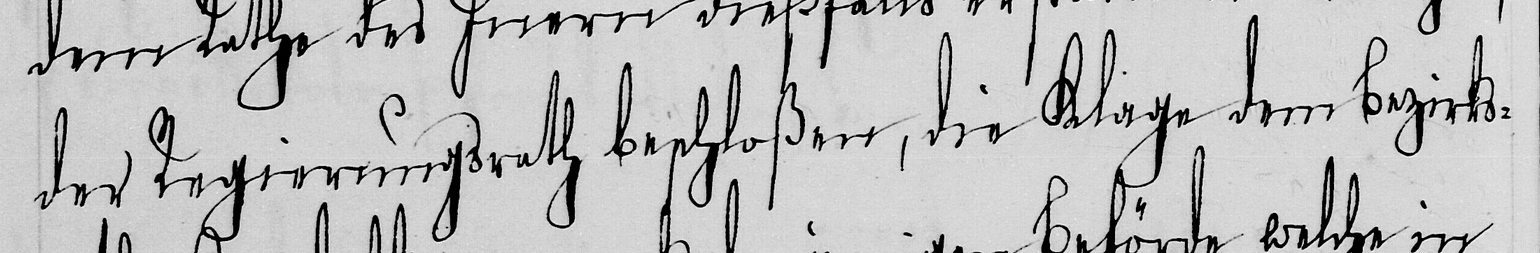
der Regierungsrath beschloßen, die Klage dem Bezirk¬
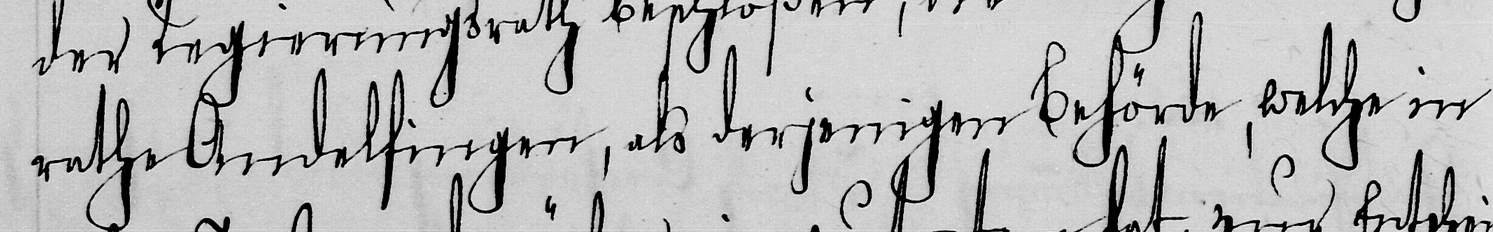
srathe Andelfingen, als derjenigen Behörde, welche in
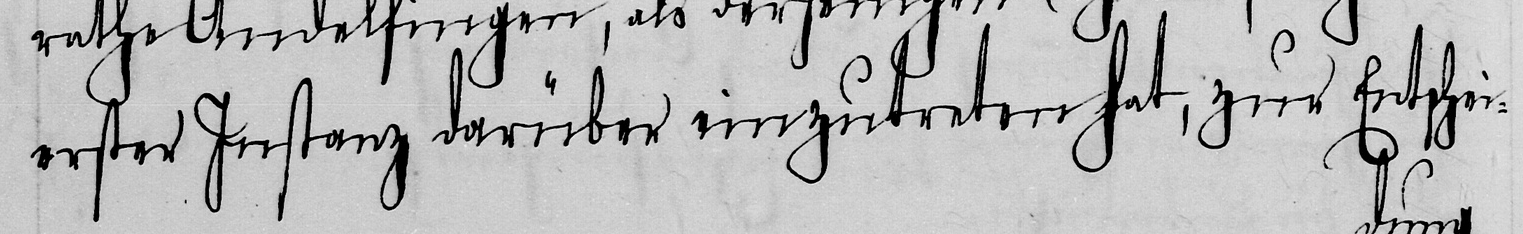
erster Instanz darüber einzutreten hat, zur Entsche¬
